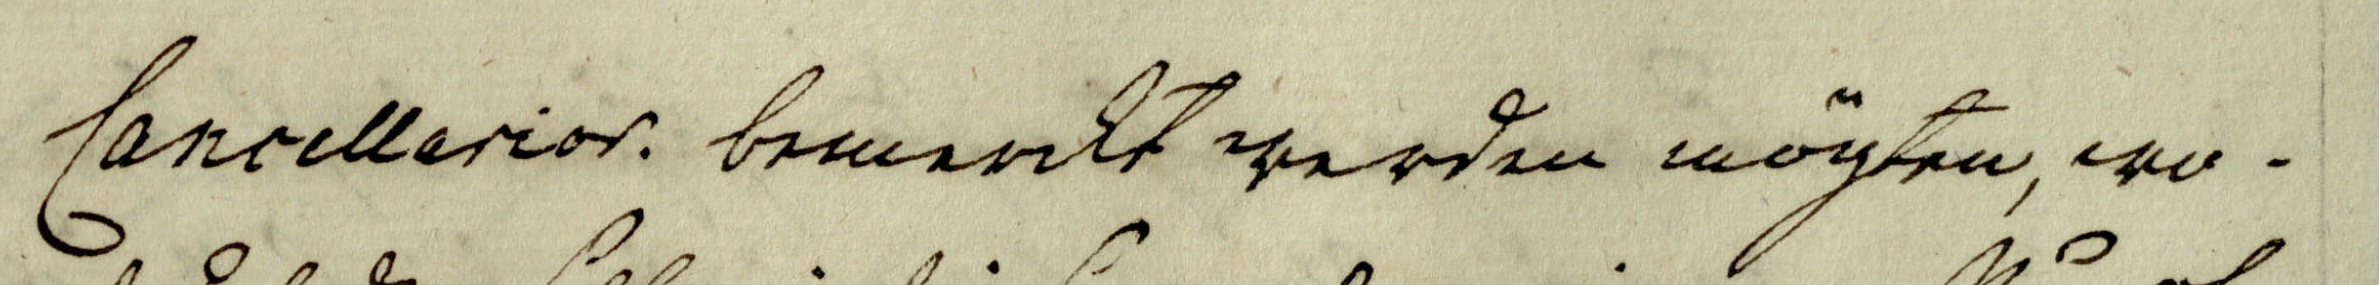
Cancellarios. bemerckt werden mögten, wo¬
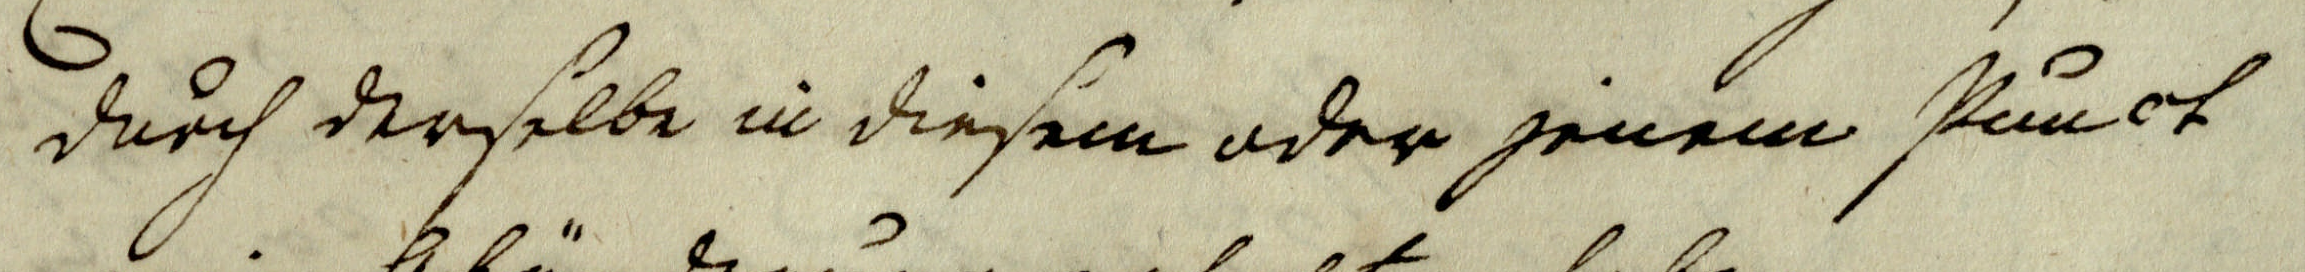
durch derselbe in diesem oder jenem Punct
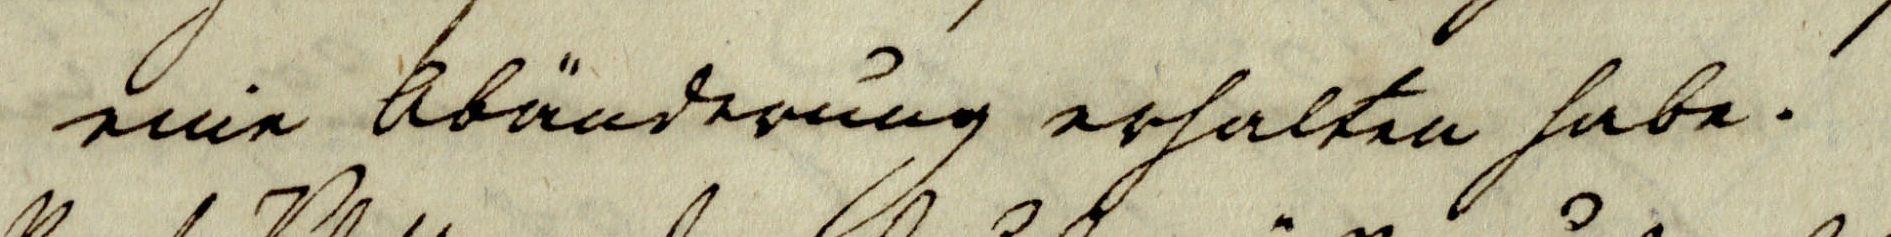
eine Abänderung erhalten habe.
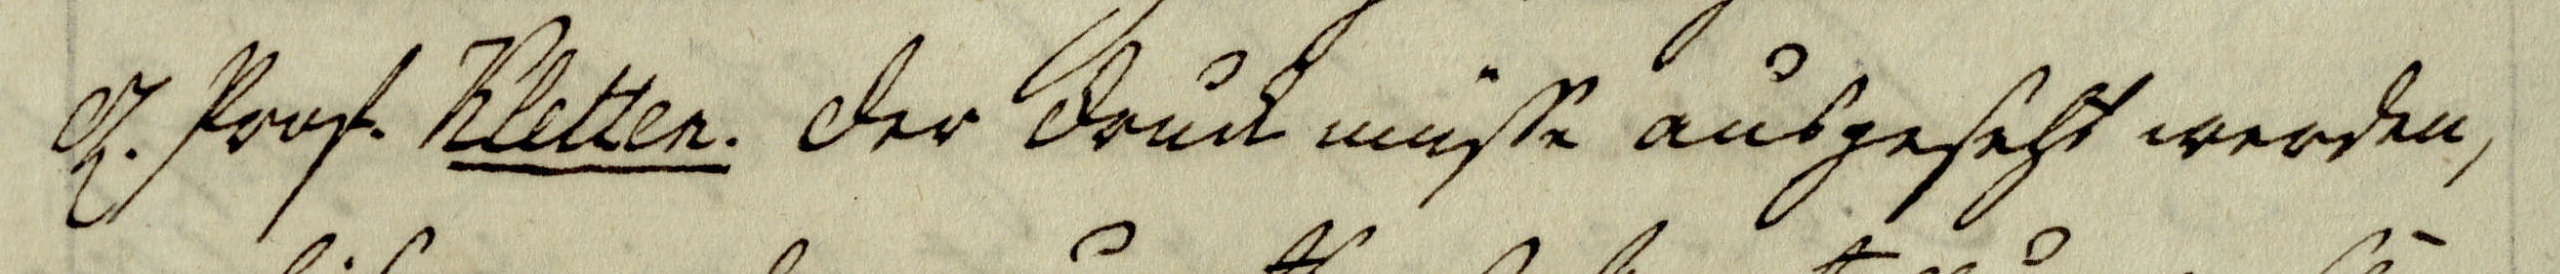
dh. Prof. Kletten. Der Druck müsse ausgesetzt werden,
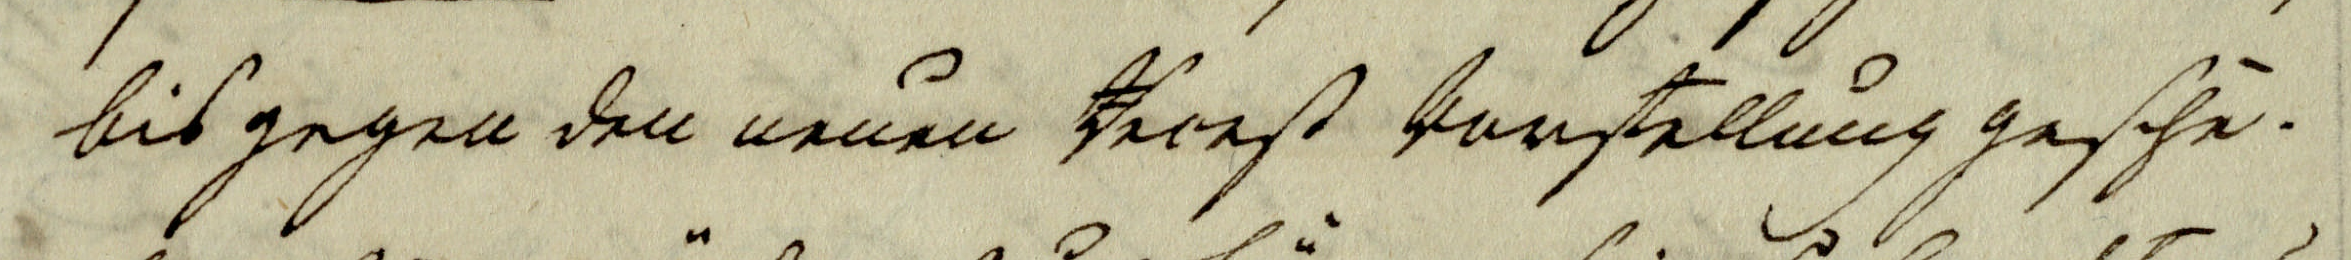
bis gegen den neuen Receß Vorstellung gesche¬
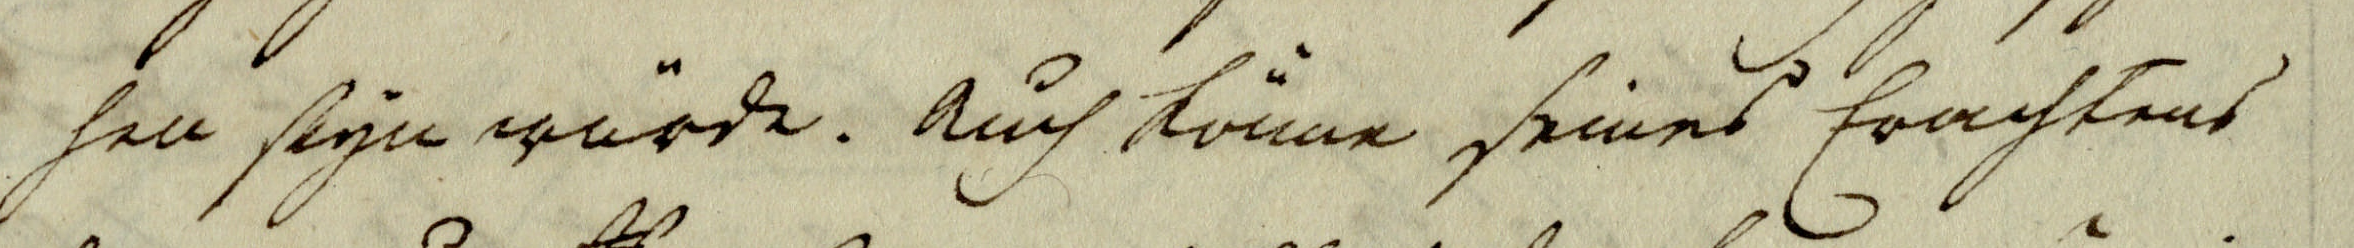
hen seÿn würde. Auch könne seines Erachtens
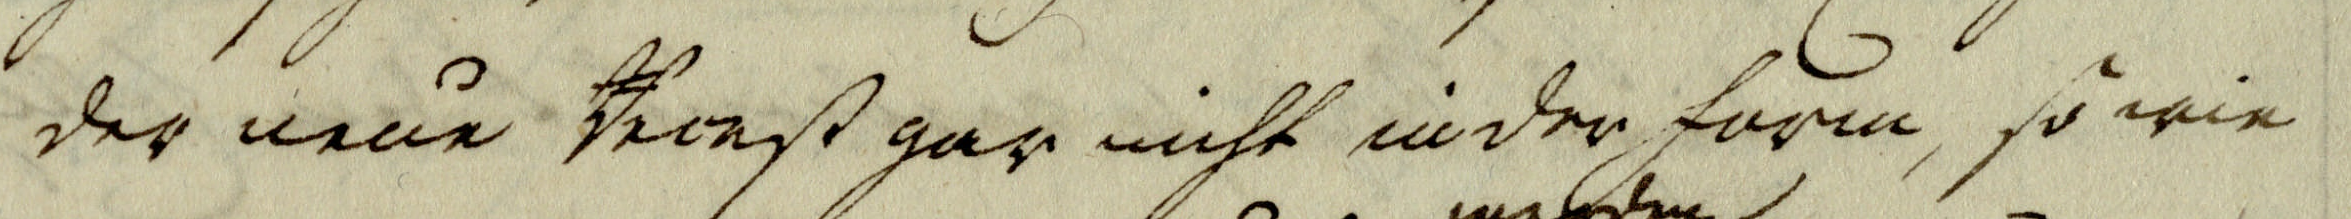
der neue Receß gar nicht in der Form, so wie
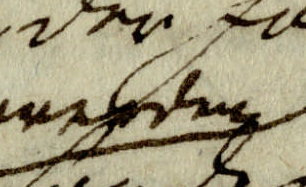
werden
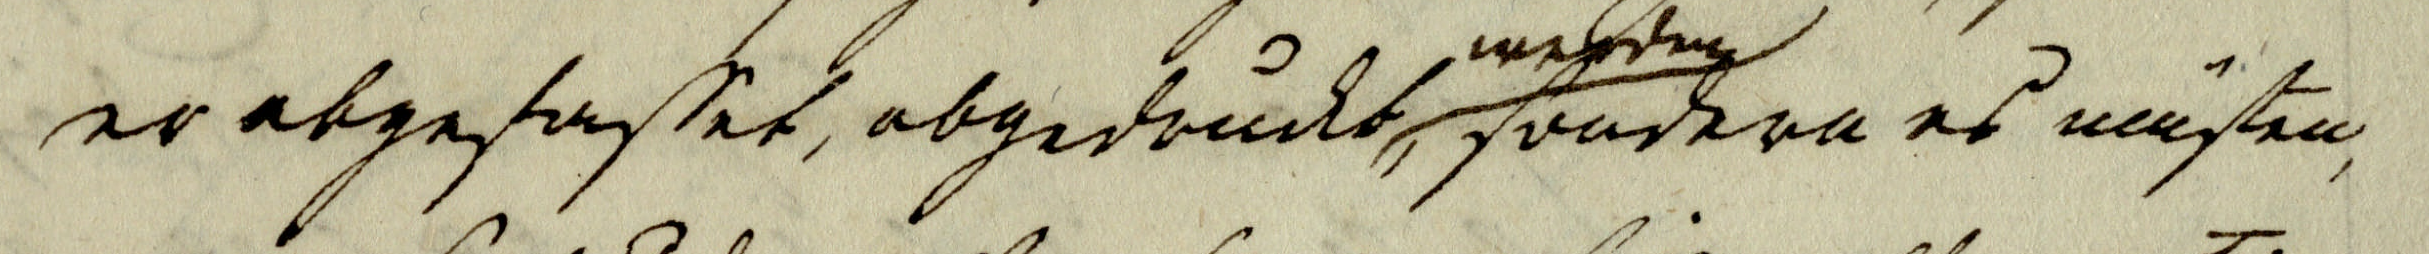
er abgefasset, abgedruckt, sondern es müsten
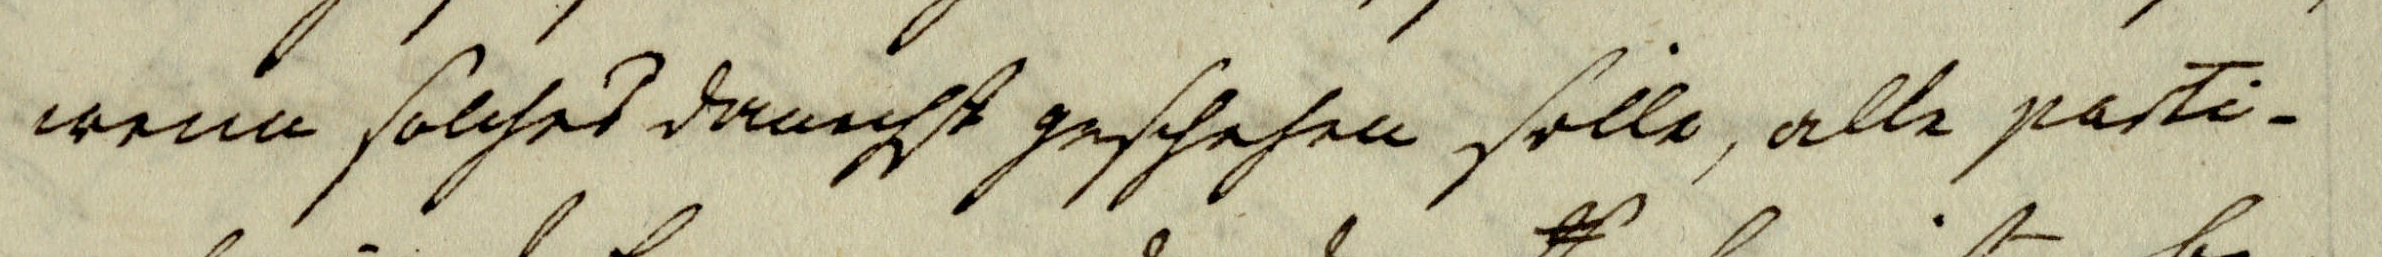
wenn solches danechst geschehen solle, alle parti¬
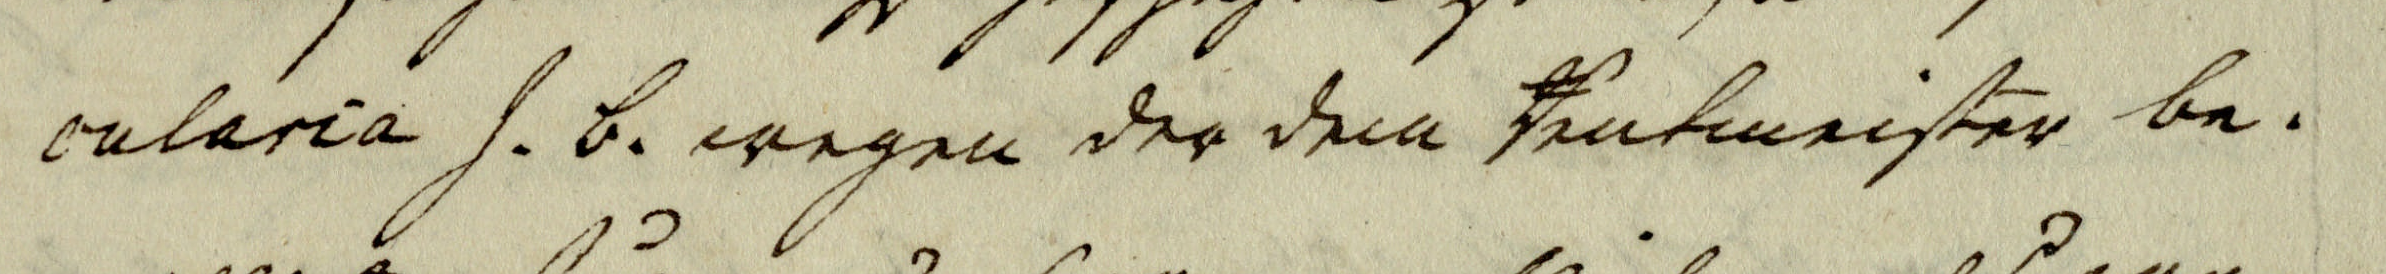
cularia z. B. wegen der dem Rentmeister be¬
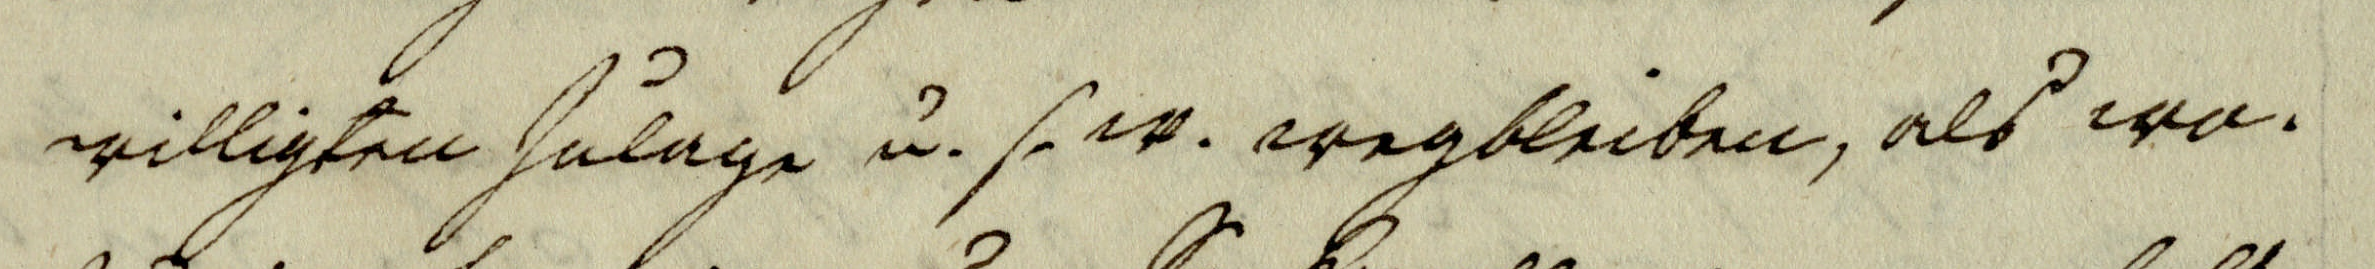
willigten Zulage u. s. w. wegbleiben, als wo¬
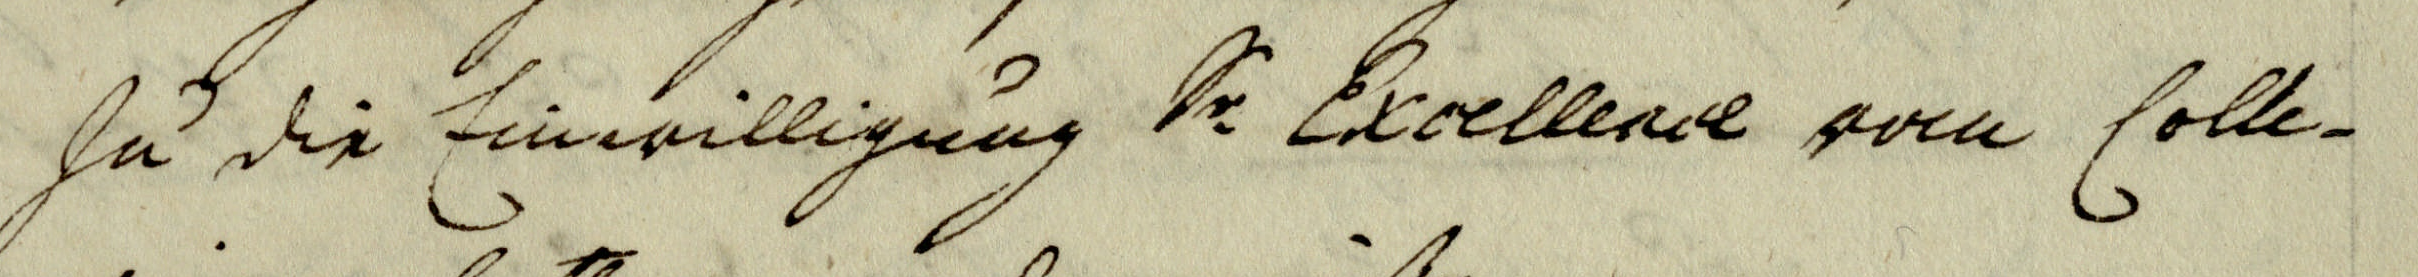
zu die Einwilligung Sr Excellence vom Colle¬
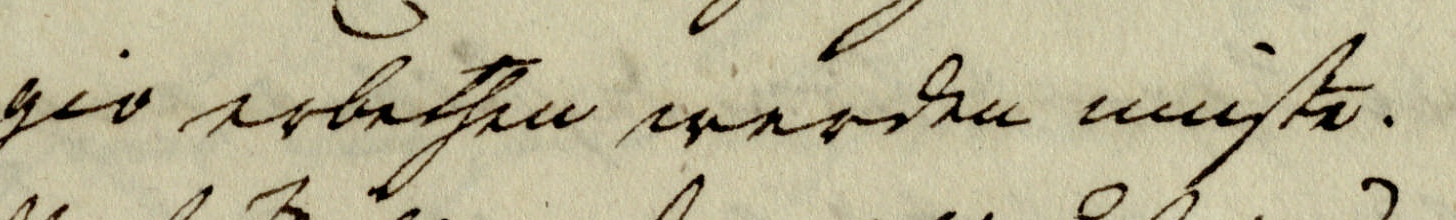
gio erbethen werden müßte.
